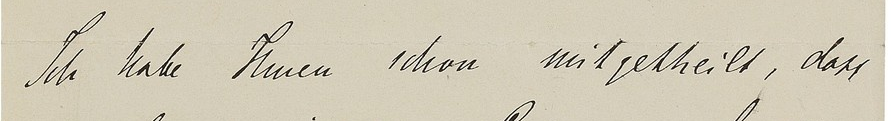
Ich habe Ihnen schon mitgetheilt, dass
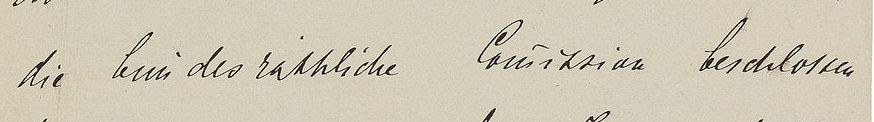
die bundesräthliche Commission beschlossen
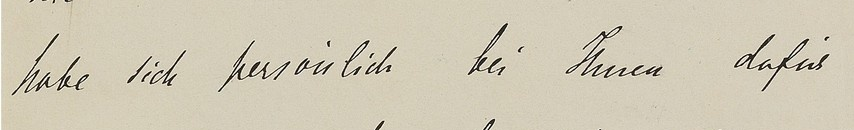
habe sich persönlich bei Ihnen dafür
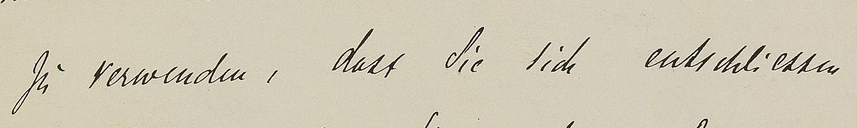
zu verwenden, dass Sie sich entschliessen
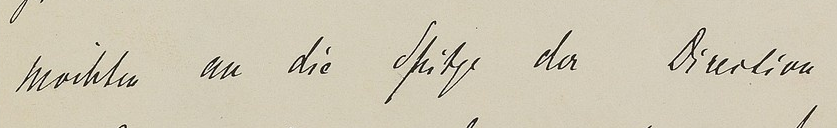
möchten an die Spitze der Direction
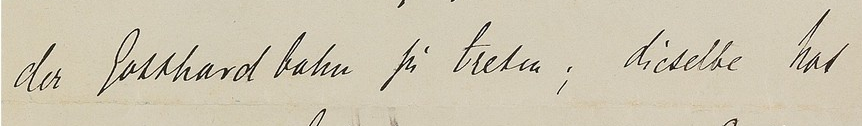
der Gotthardbahn zu treten; dieselbe hat
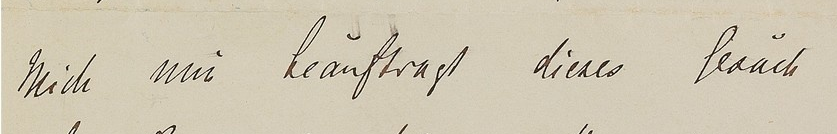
mich nun beauftragt dieses Gesuch
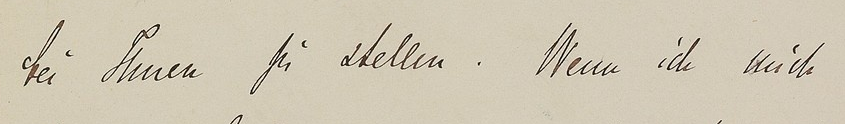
bei Ihnen zu stellen. Wenn ich mich
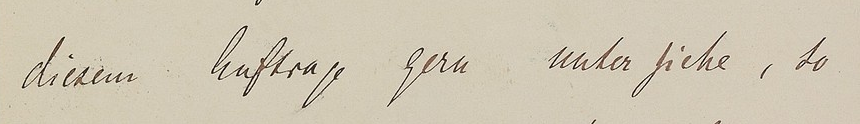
diesem Auftrage gern unterziehe, so
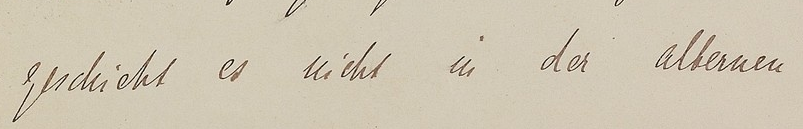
geschieht es nicht in der albernen
